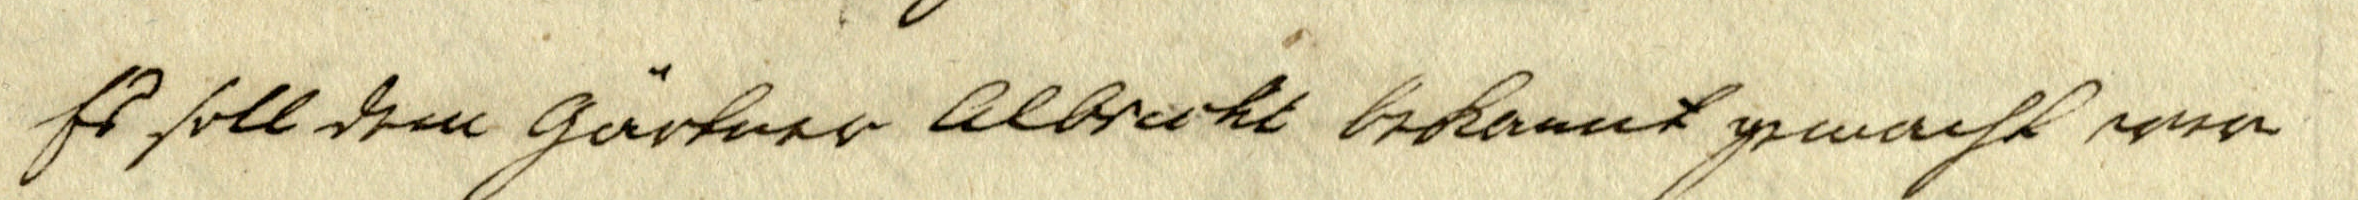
Es soll dem Gärtner Albrecht bekannt gemacht wer¬
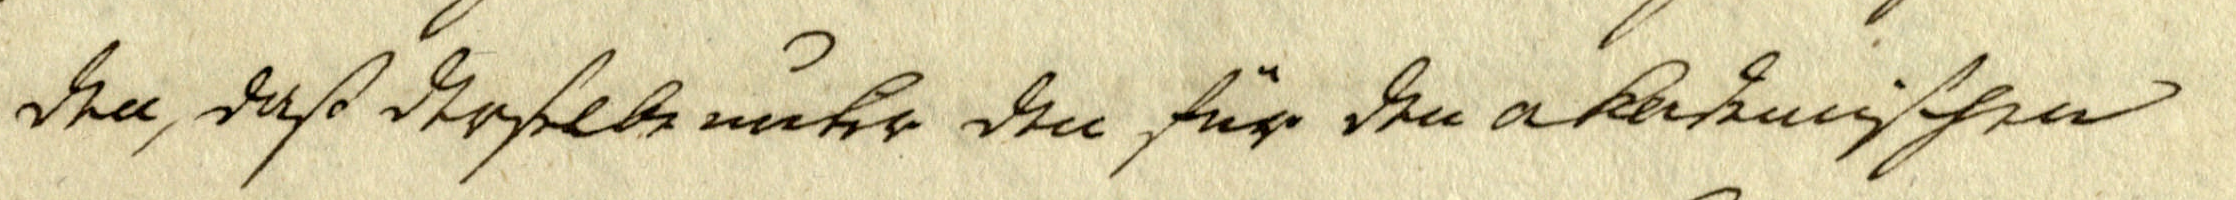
den, daß derselbe unter den für den akademischen
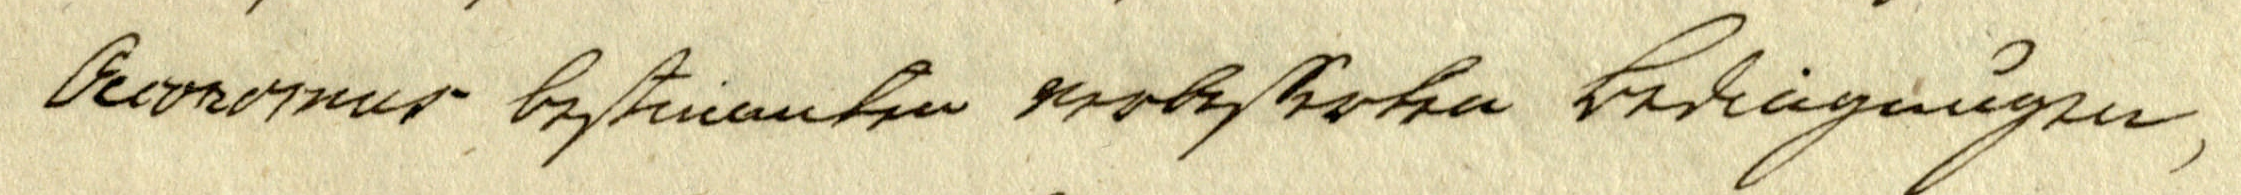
Oeconomus bestimmten verbesserten Bedingungen
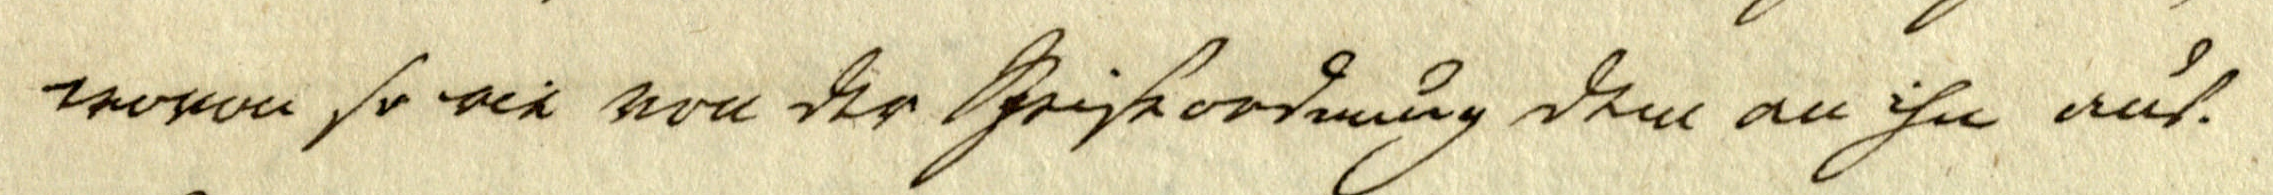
wovon so wie von der Speiseordnung dem an ihn aus¬
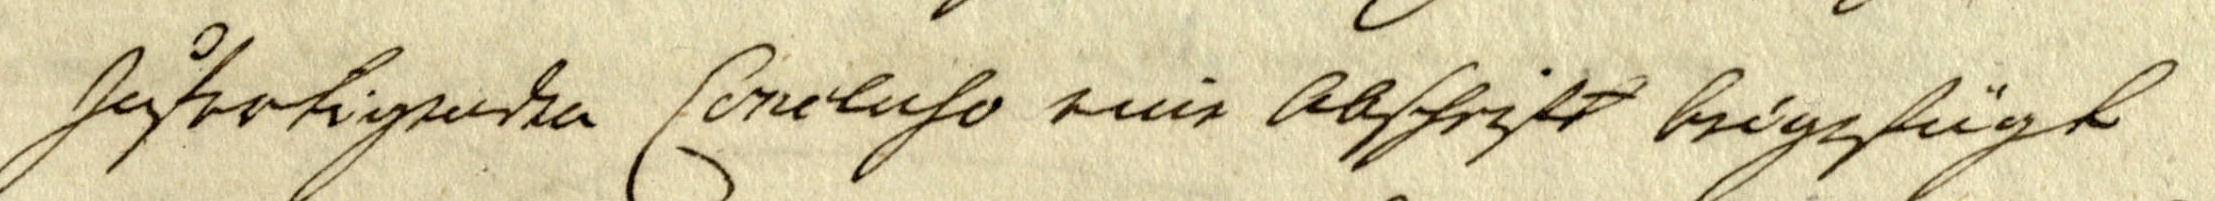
zufertigenden Concluso eine Abschrift beigefügt
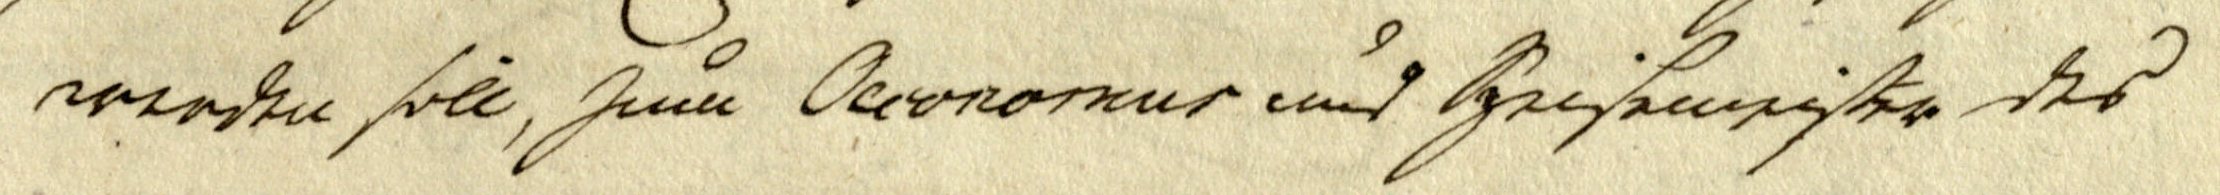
werden soll, zum Oeconomus und Speisemeister des
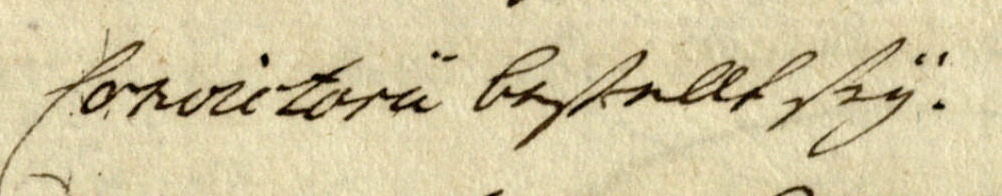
Convictorii bestellt seÿ.
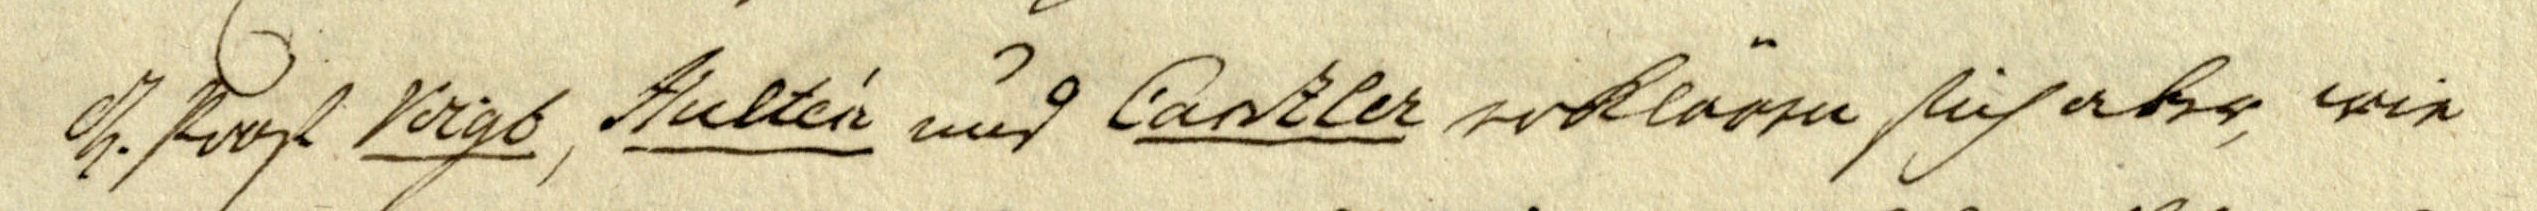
dh. Prof. Voigt, Hultèn und Canzler erklären sich aber, wie
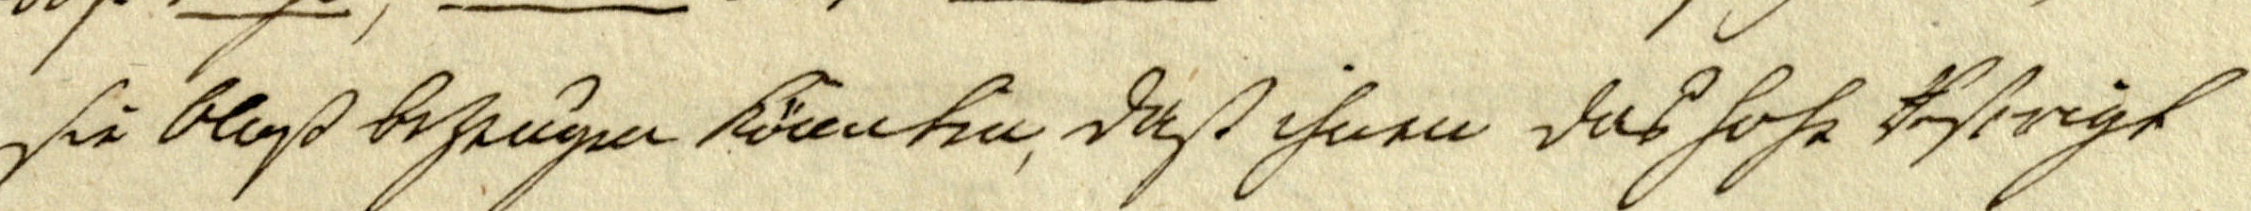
sie bloß bezeugen könnten, daß ihnen das hohe Rescript
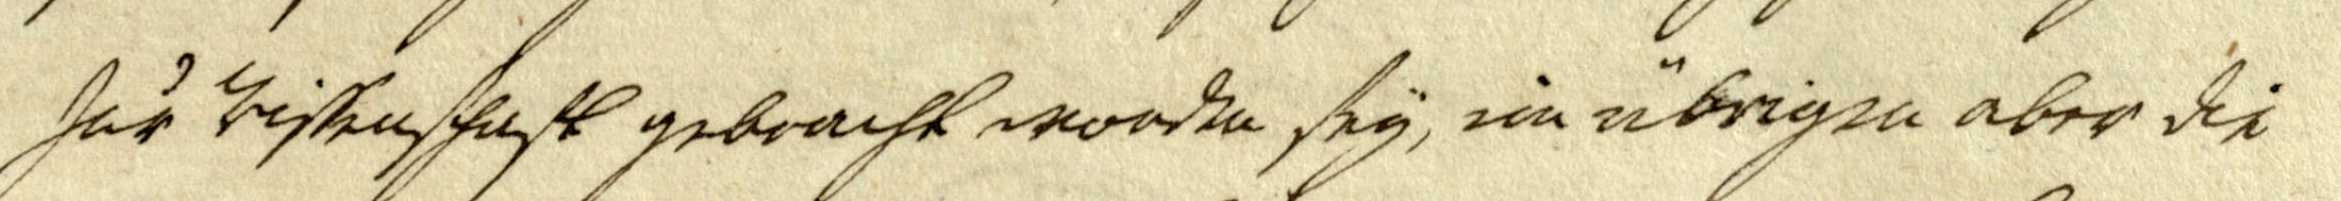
zur Wissenschaft gebracht worden seÿ, im übrigen aber die
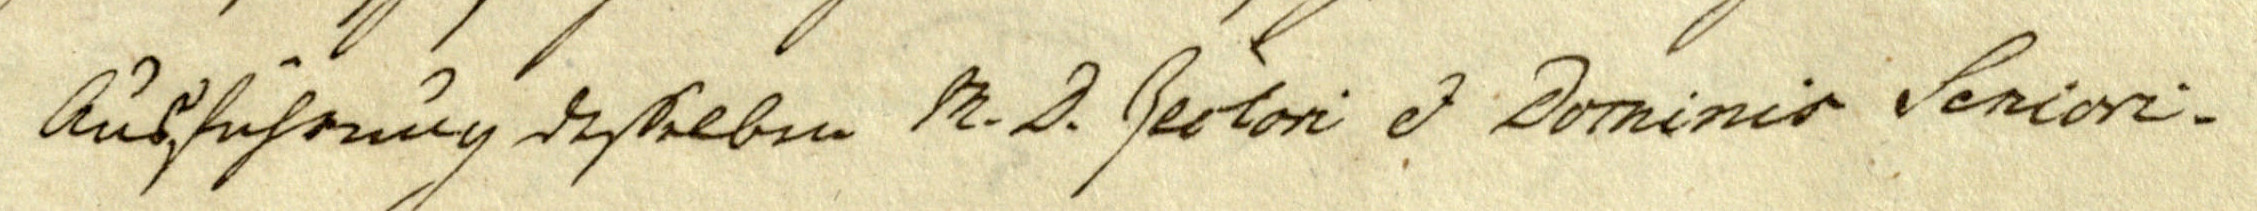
Ausführung desselben M. D. Rectori et Dominis Seniori¬
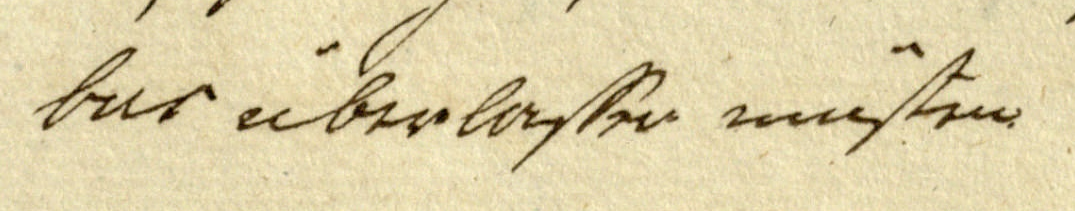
bus überlassen müsten.
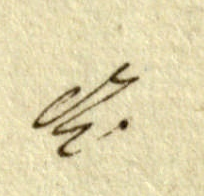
dh.
